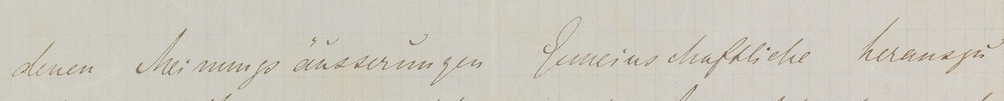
denen Meinungsäusserungen Gemeinschaftliche herauszu-
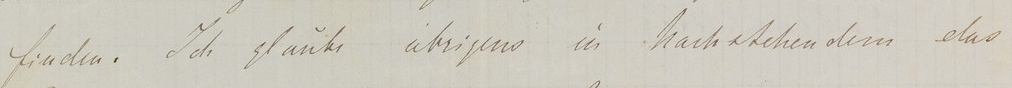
finden. Ich glaube übrigens in nachstehendem das
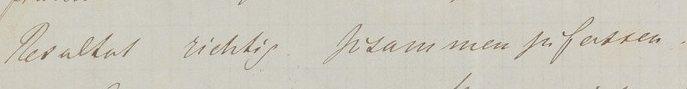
Resultat richtig zusammenzufassen.
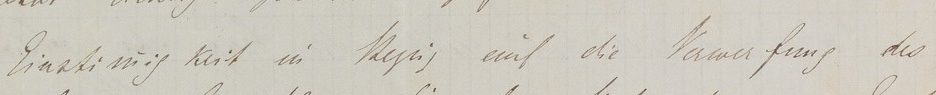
Einstimmigkeit in Bezug auf die Verwerfung des
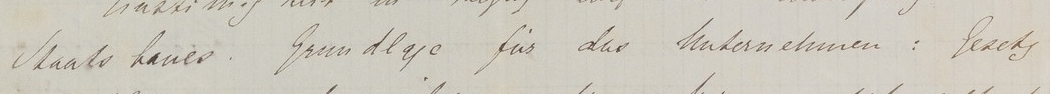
Staatsbaues. Grundlage für das Unternehmen: Gesetz
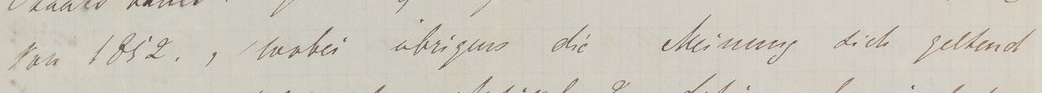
von 1852, wobei übrigens die Meinung sich geltend
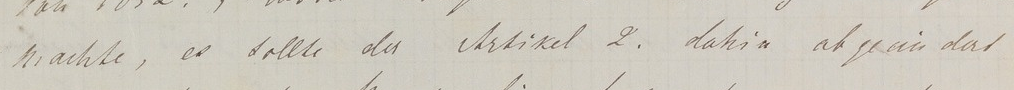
machte, es sollte der Artikel 2 dahin abgeändert
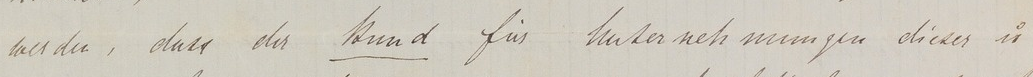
werden, dass der Bund für Unternehmungen dieser u
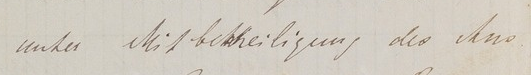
unter Mitbetheiligung des Aus-
